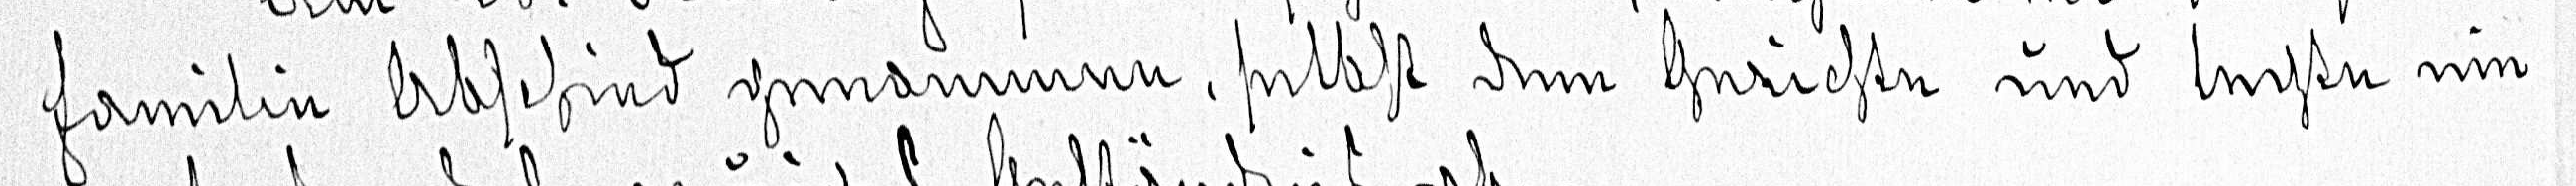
Familie Abschied genommen, selbst dem Gerichte und legte ein
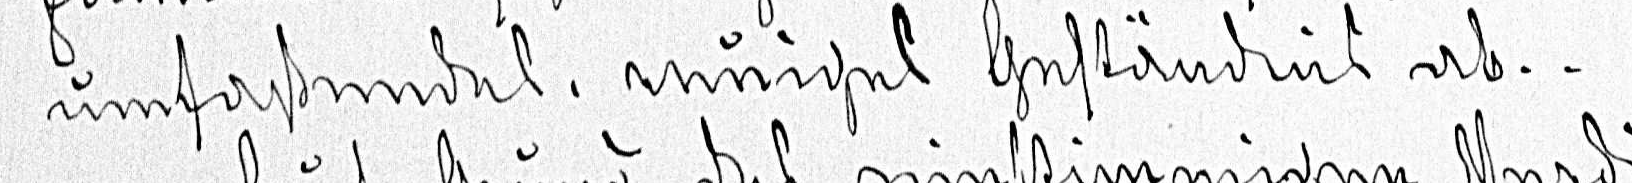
umfaßendes, reuiges Geständnis ab.
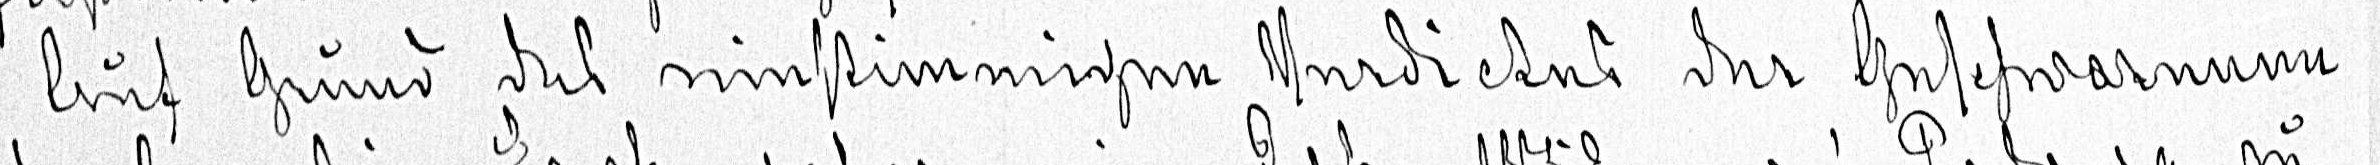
Auf Grund das einstimmigen Verdictes der Geschworenen
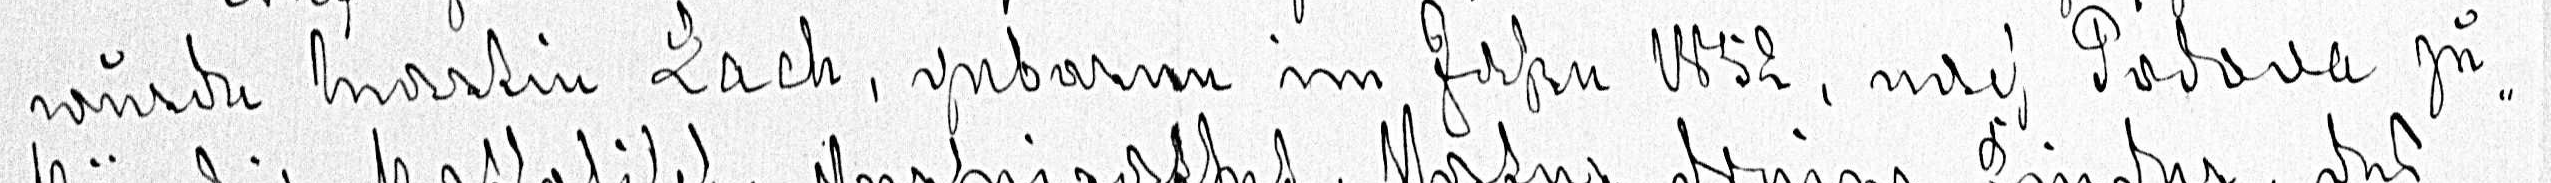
wurde Martin Lach, geboren i Jahre 1852, nach Podova zu¬
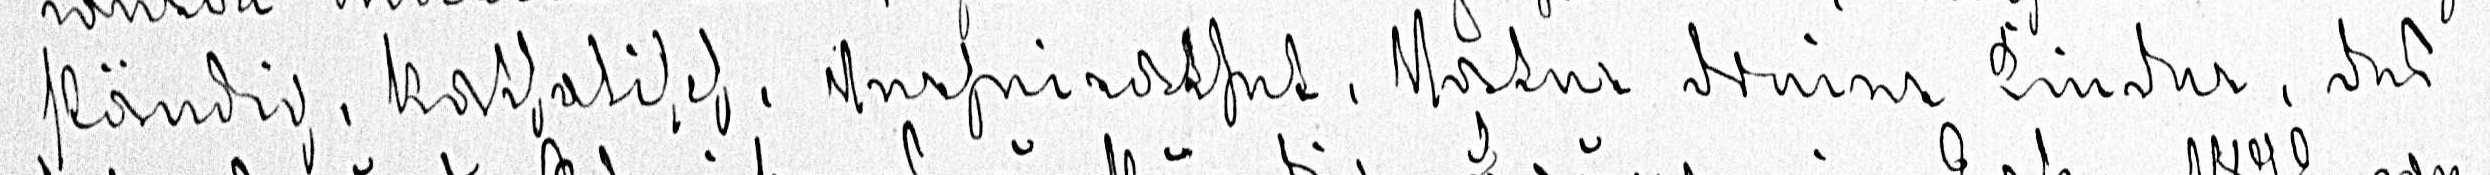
ständig, katholisch, verheirathet, Vater dreier Kinder, des
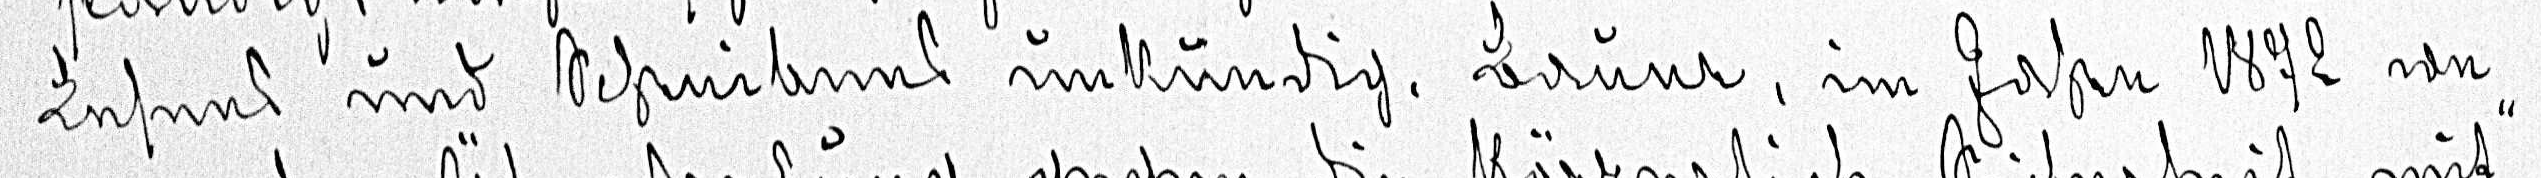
Lesens und Schreibens unkundig, Bauer, im Jahre 1872 we¬
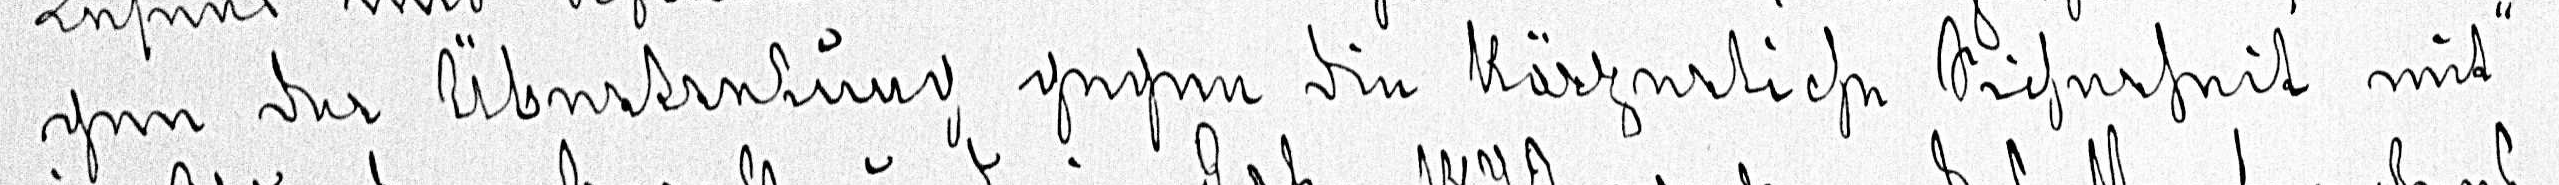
gen der Übertretung gegen die körperliche Sicherheit mit
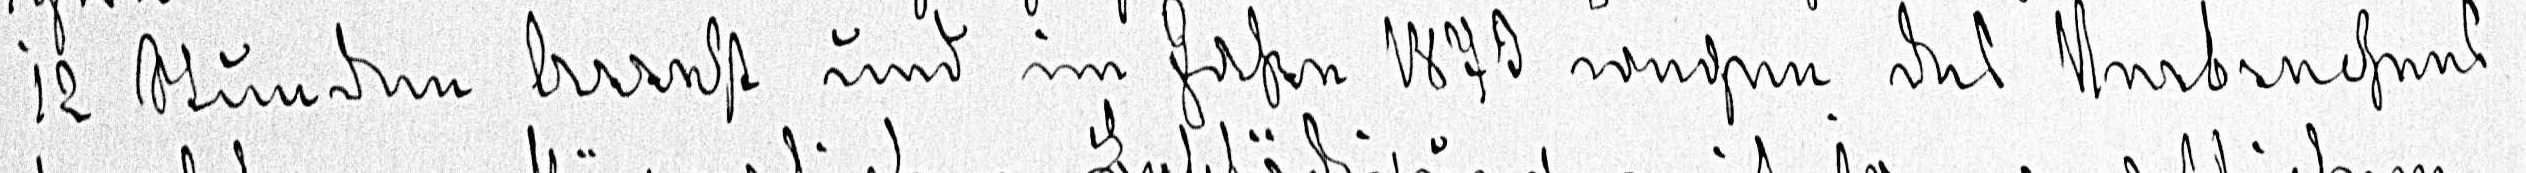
12 Student Arrest und im Jahre 1873 wegen des Verbrechens
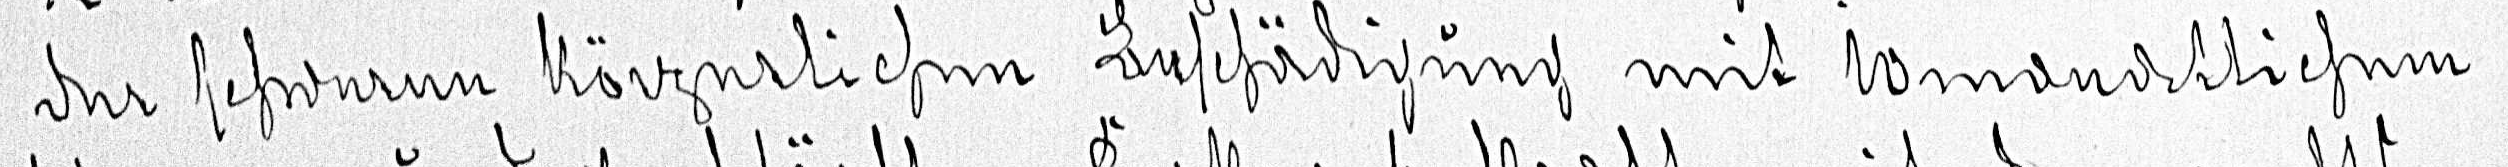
der schweren körperlichen Beschädigung mit 10monatlichem
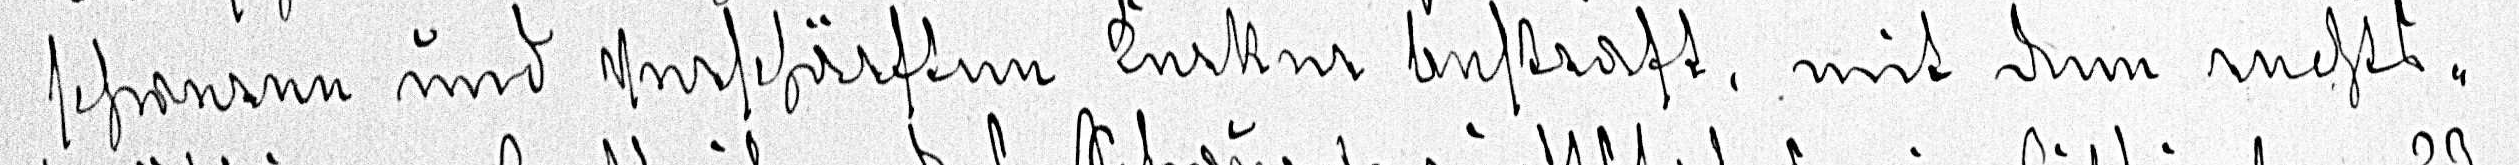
schweren und verschärften Kerker bestraft, mit dem rechts¬
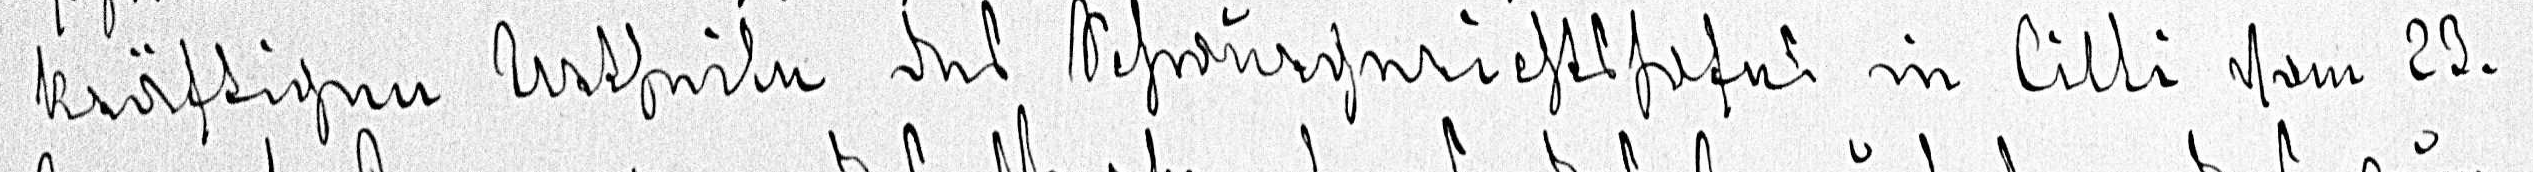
kräftigen Urtheile des Schwurgerichtshofes in Cilli vom 23.
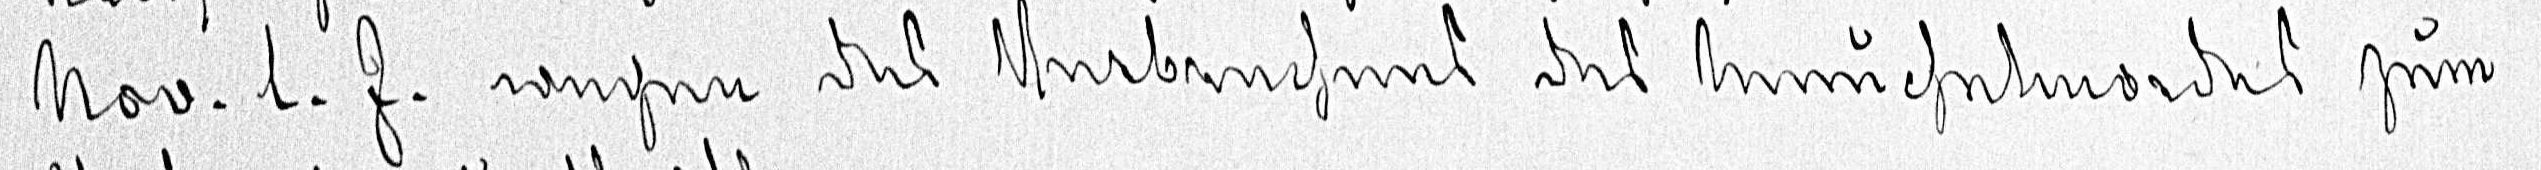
Nov. l. J. wegen des Verbrechens des Meuchelmordes zum
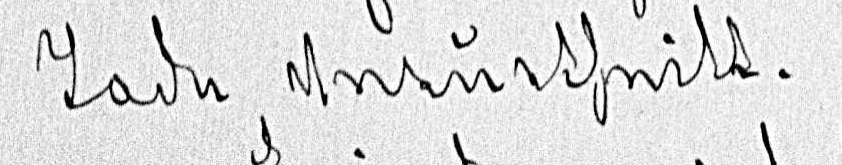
Tode verurtheilt.
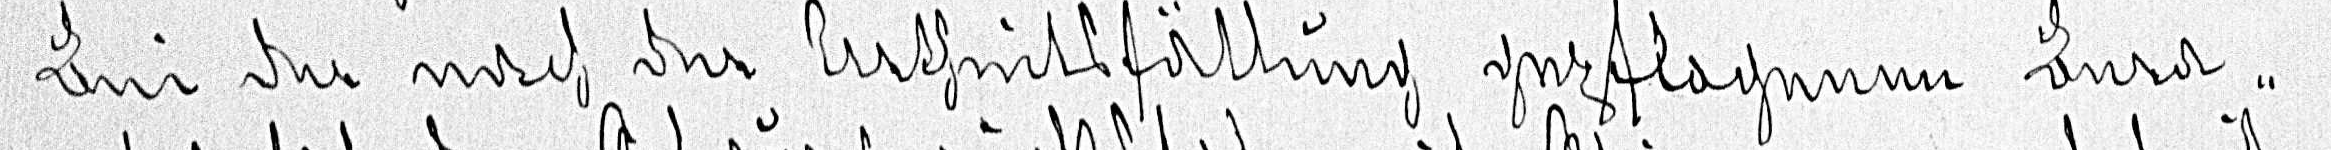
Bei der nach der Urtheilsfällung gepflogenen Bera¬
